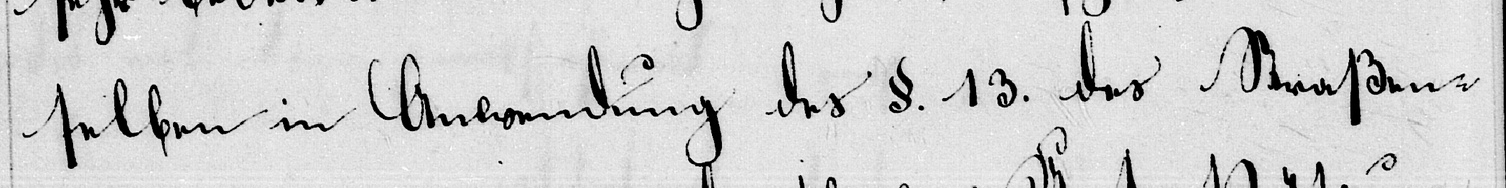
selben in Anwendung des §. 13. des Straßen¬
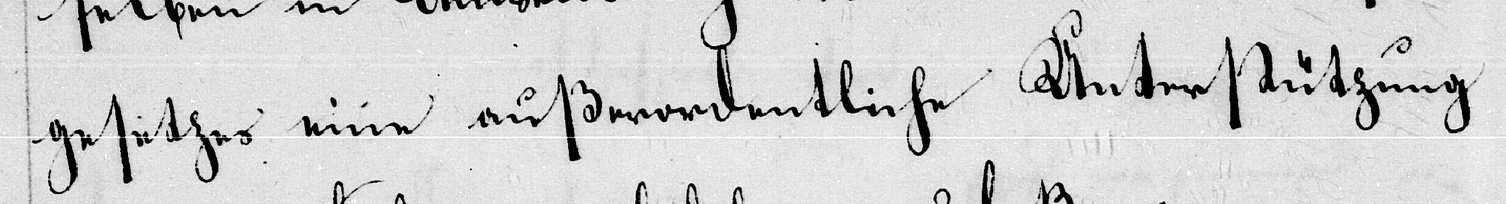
gesetzes eine außerordentliche Unterstützung
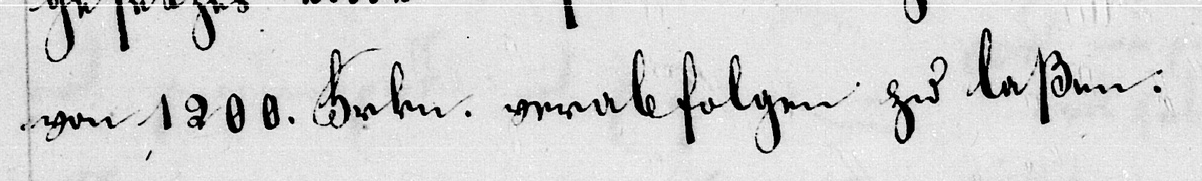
von 1200. Frkn. verabfolgen zu laßen.
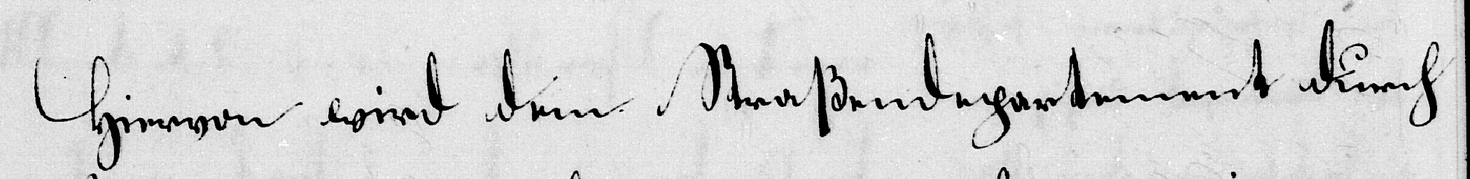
Hiervon wird dem Straßendepartement durch
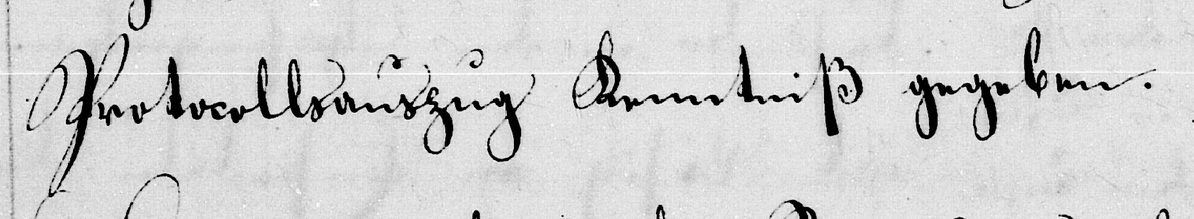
Protocollsauszug Kenntniß gegeben.
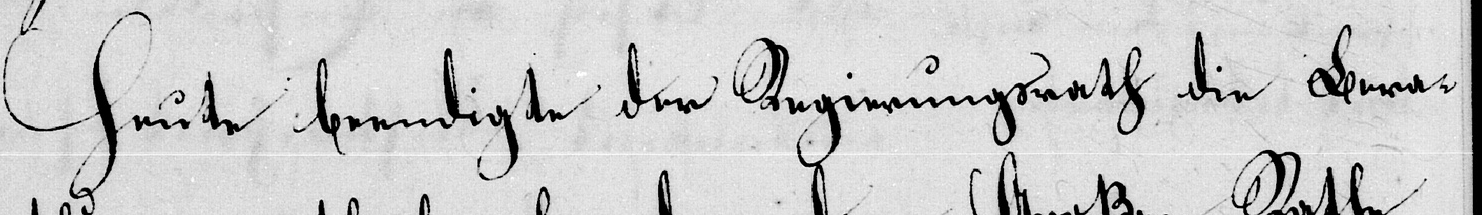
Heute beendigte der Regierungsrath die Bera¬
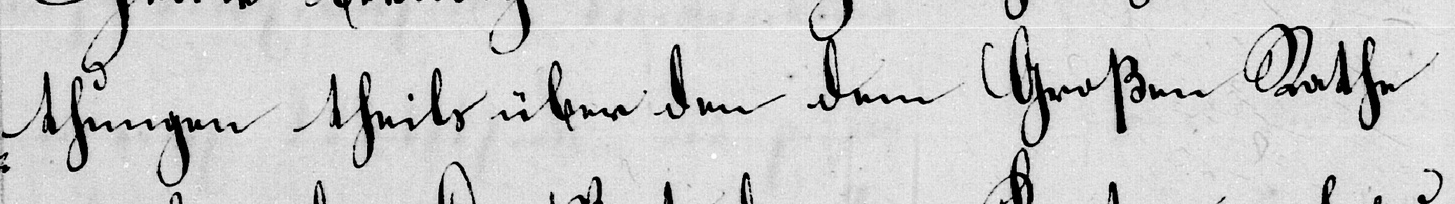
thungen theils über den dem Großen Rathe
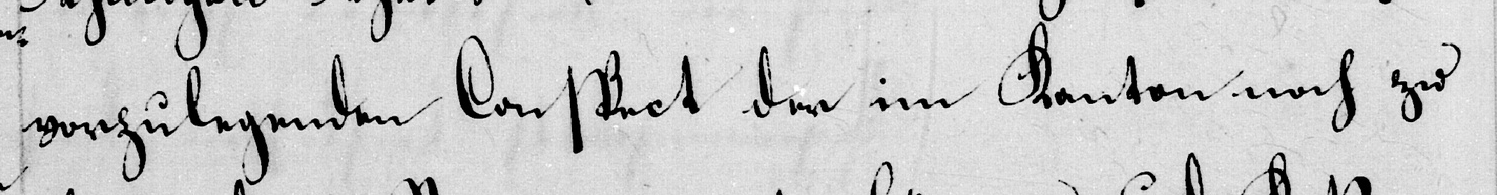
vorzulegenden Conspect der im Kanton noch zu
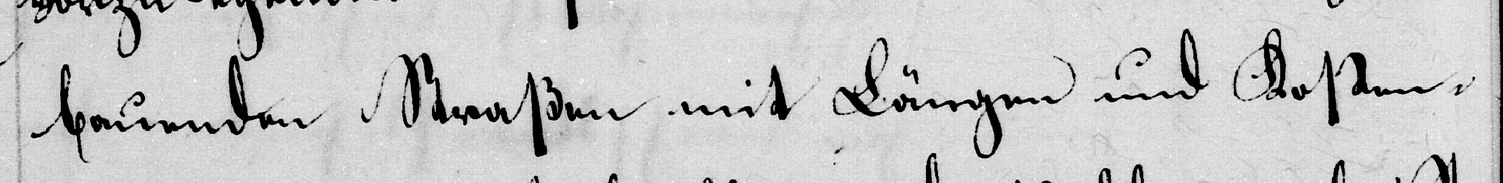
bauenden Straßen mit Längen und Kosten¬
